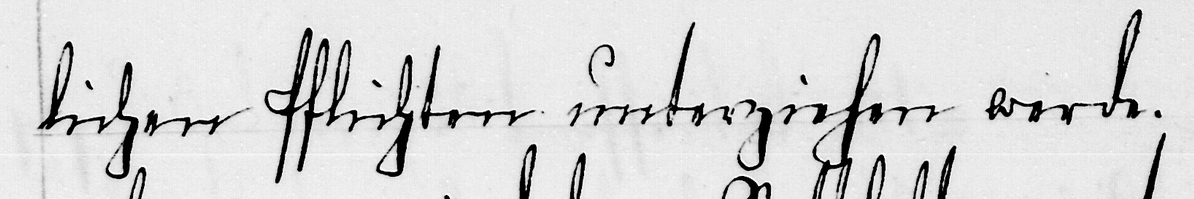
lichen Pflichten unterziehen werde.
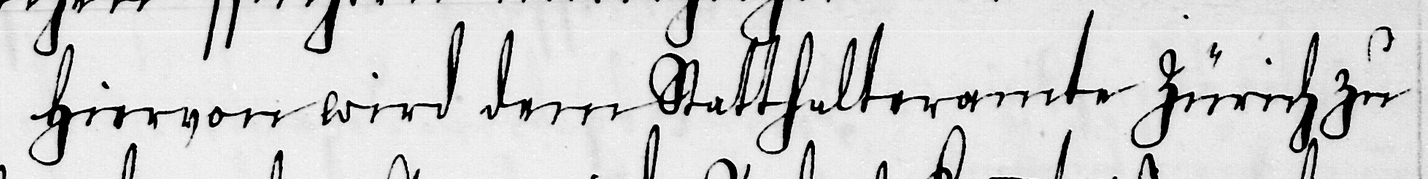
Hiervon wird dem Statthalteramte Zürich zu
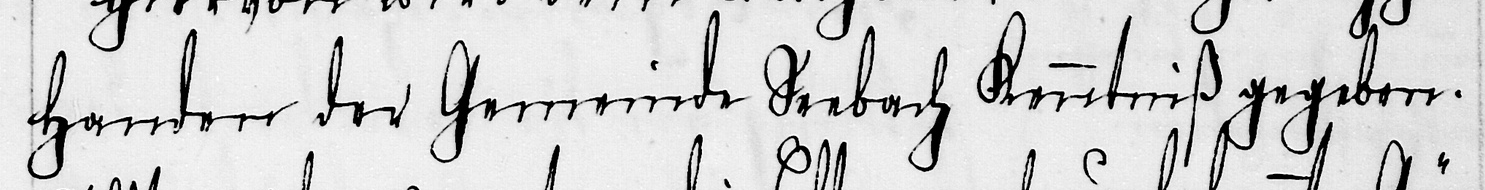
Handen der Gemeinde Seebach Kenntniß gegeben.
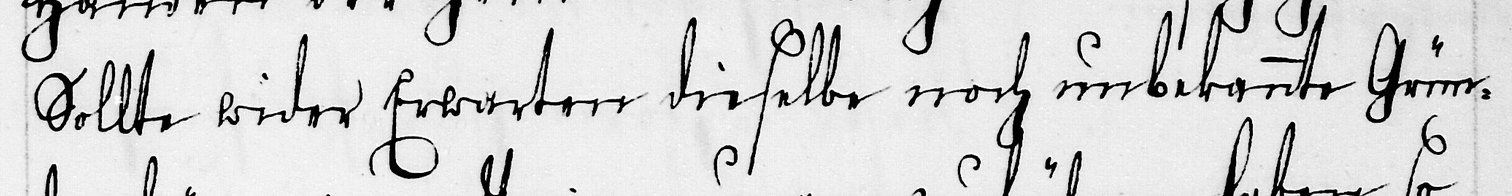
Sollte wider Erwarten dieselbe noch unbekannte Grün¬
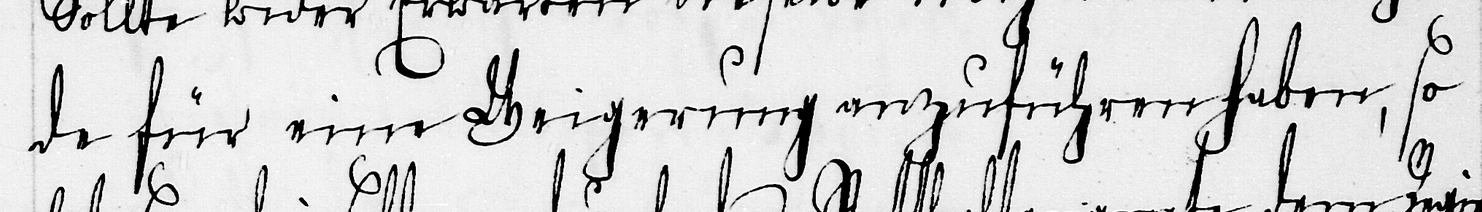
de für eine Weigerung anzuführen haben, so
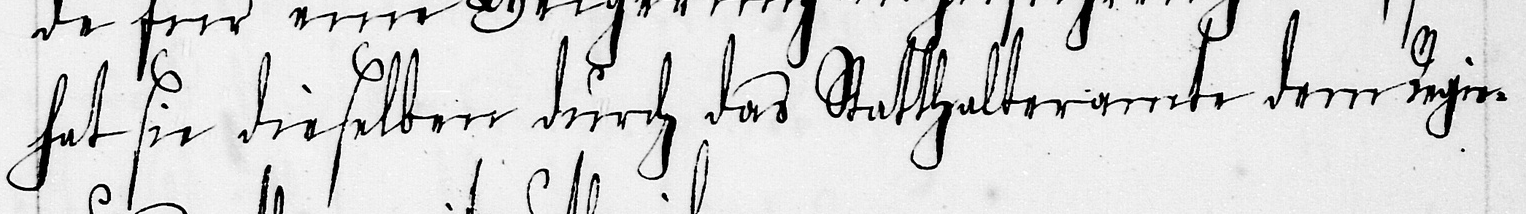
hat sie dieselben durch das Statthalteramte dem Regie¬
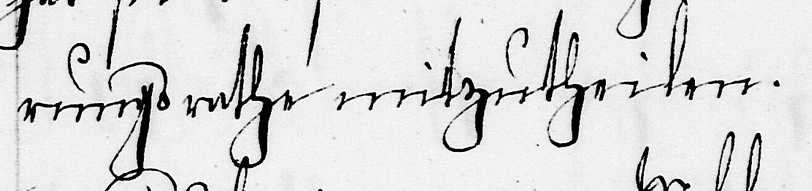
rungsrathe mitzutheilen.
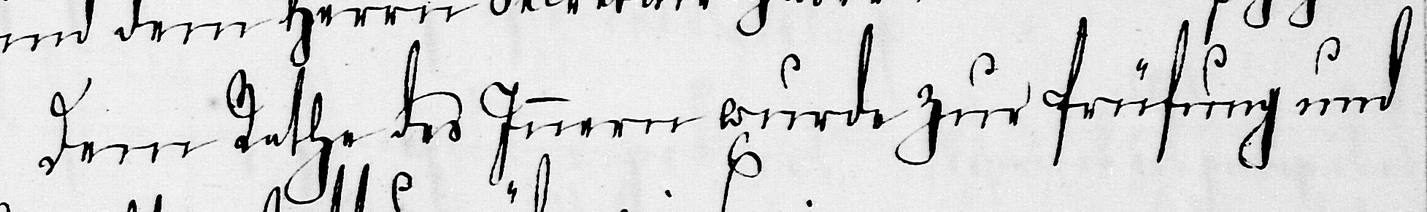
Dem Rathe des Innern wurde zur Prüfung und
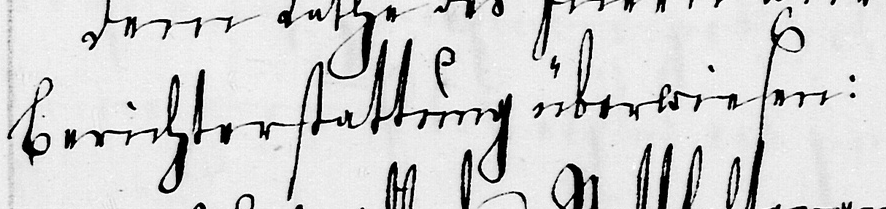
Berichterstattung überwiesen:
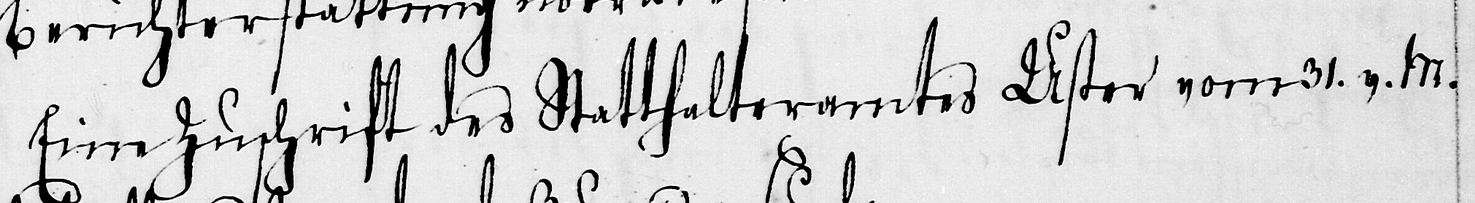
Eine Zuschrift des Statthalteramtes Uster vom 31. v. M.
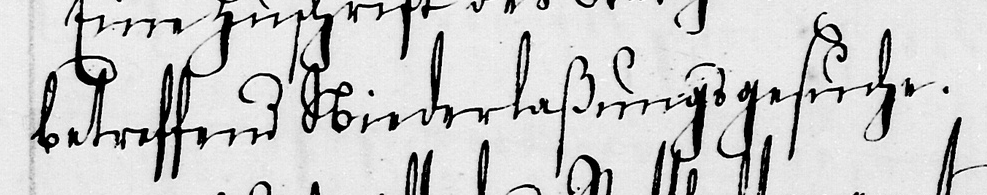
betreffend Niederlaßungsgesuche.
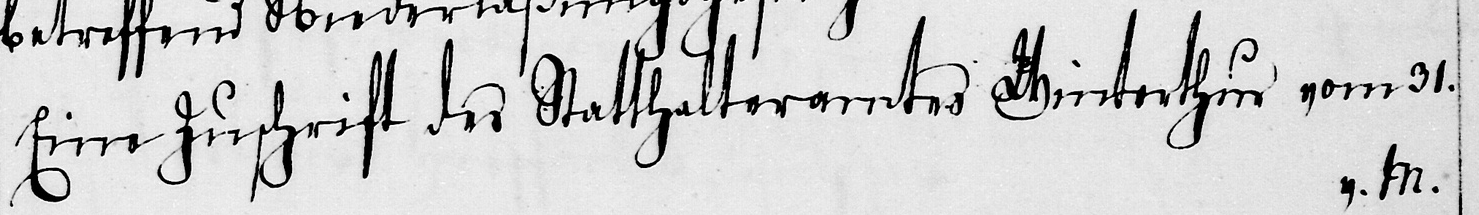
Eine Zuschrift des Statthalteramtes Winterthur vom 31.
